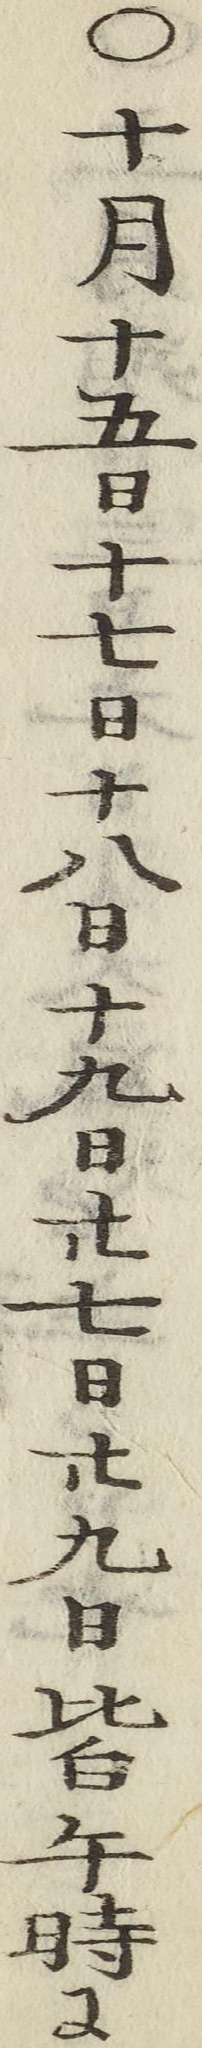○十月十五日十七日十八日十九日廿七日廿九日皆午時に
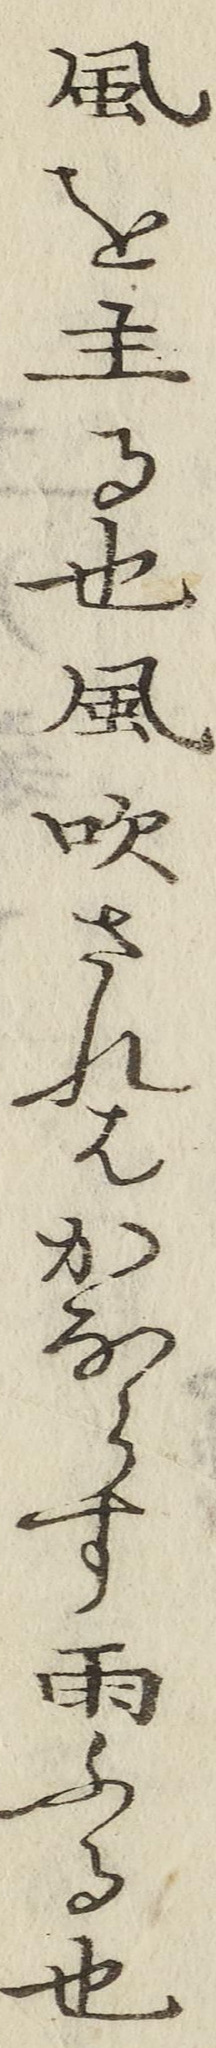風を主る也風吹されはかならす雨ふる也
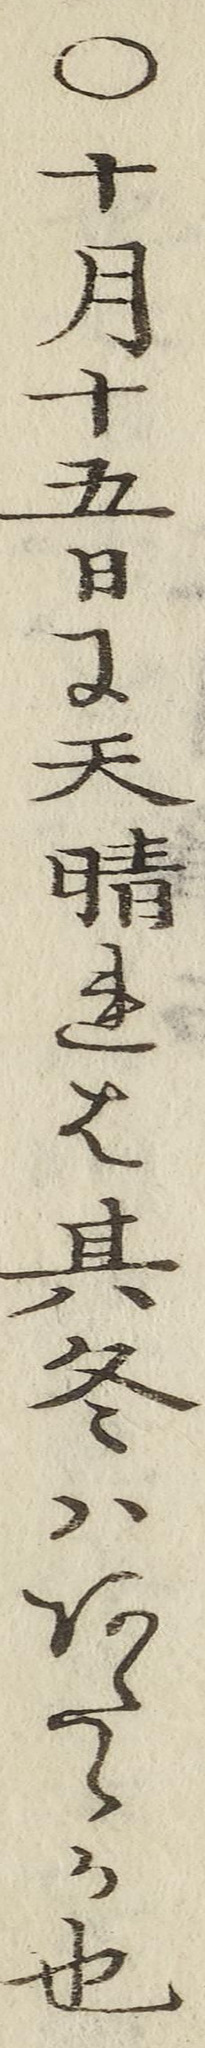○十月十五日に天晴れは其冬はあたゝか也
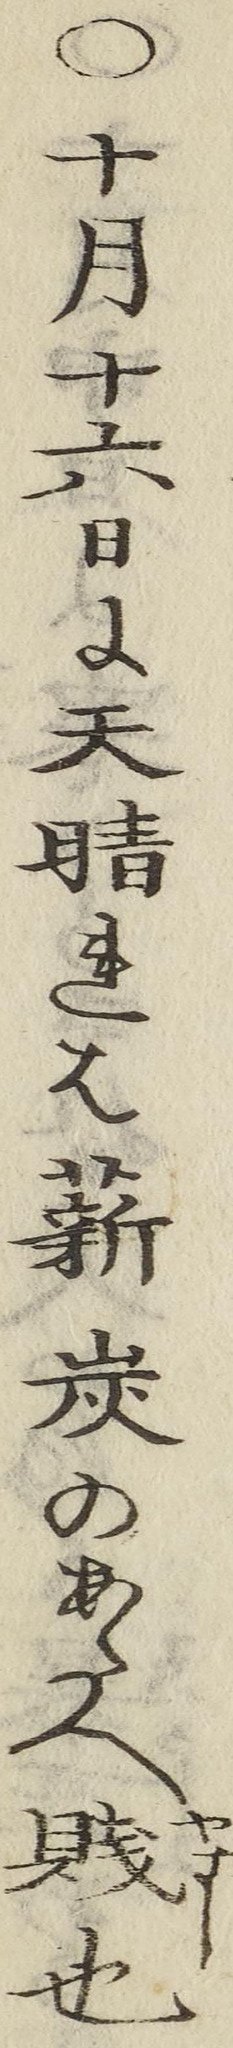○十月十六日に天晴れは薪炭のあたへ賤也

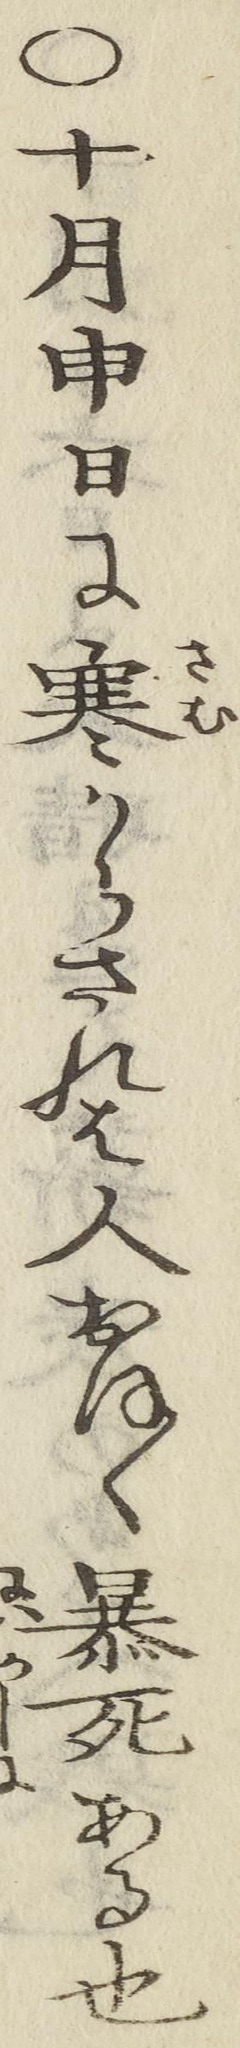○十月申日に寒からされは人おほく暴死ある也
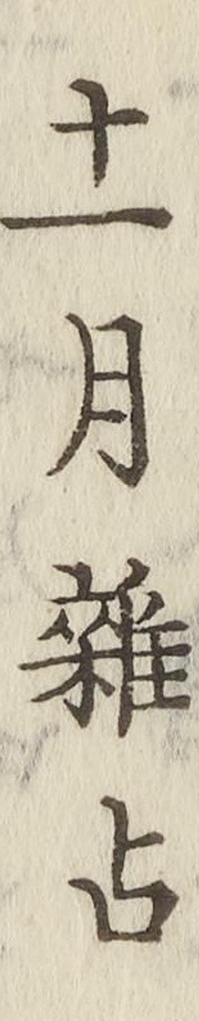十一月雑占
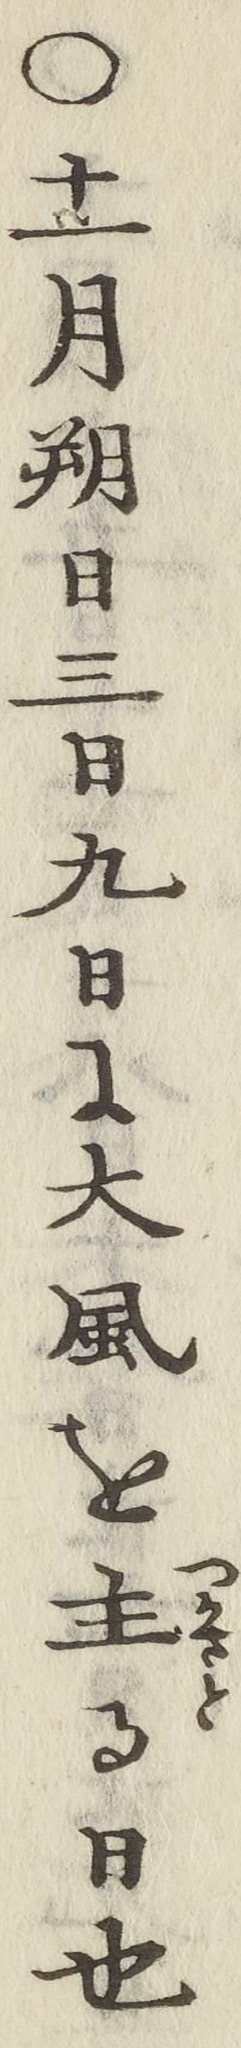○十一月朔日三日九日に大風を主る日也
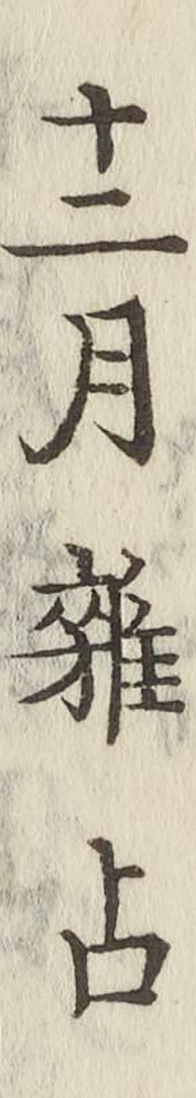十二月雑占
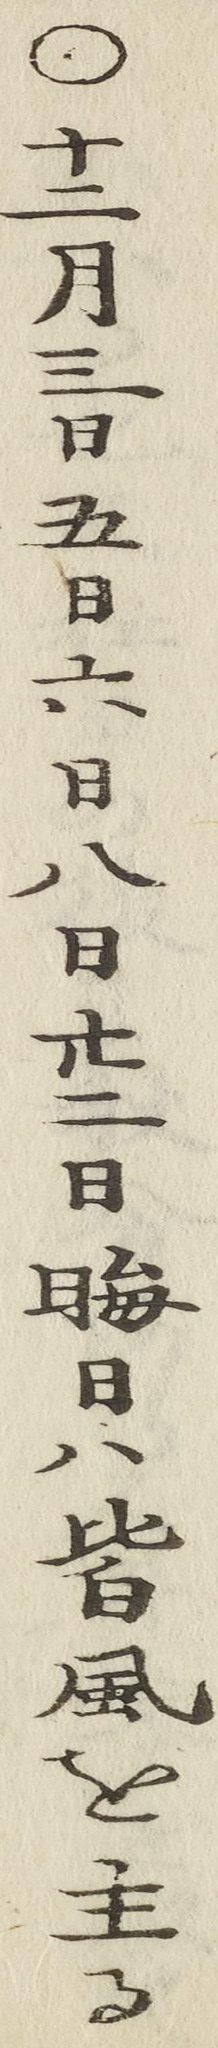○十二月三日五日六日八日廿ニ日晦日は皆風を主る
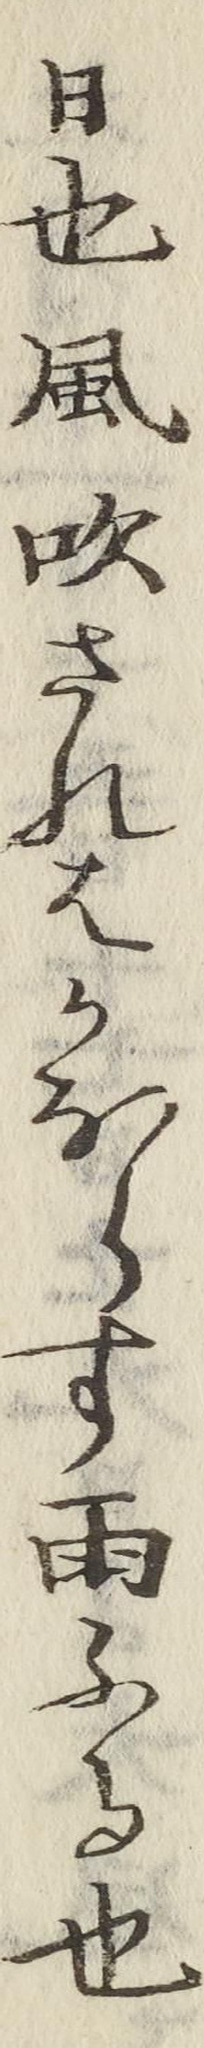日也風吹かされはかならす雨ふる也
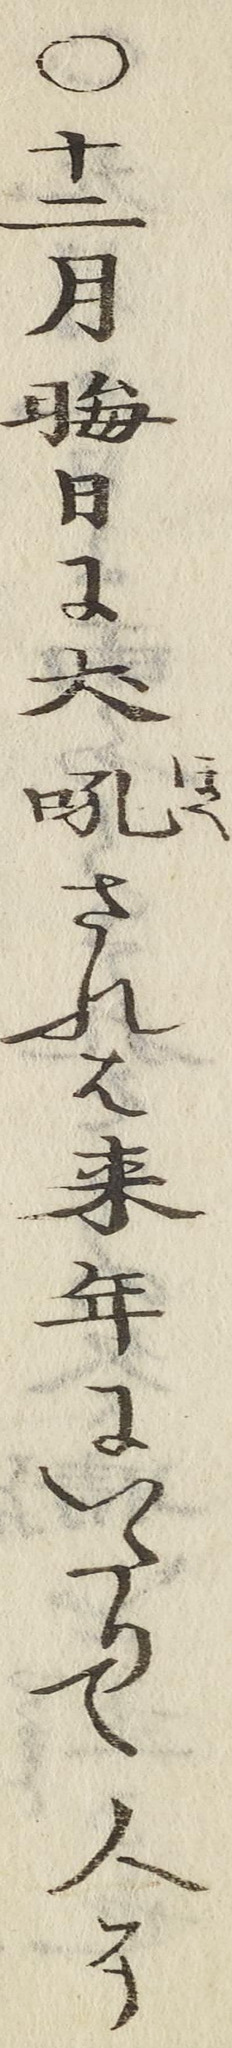○十二月晦日に犬吼されは来年にいたりて人に
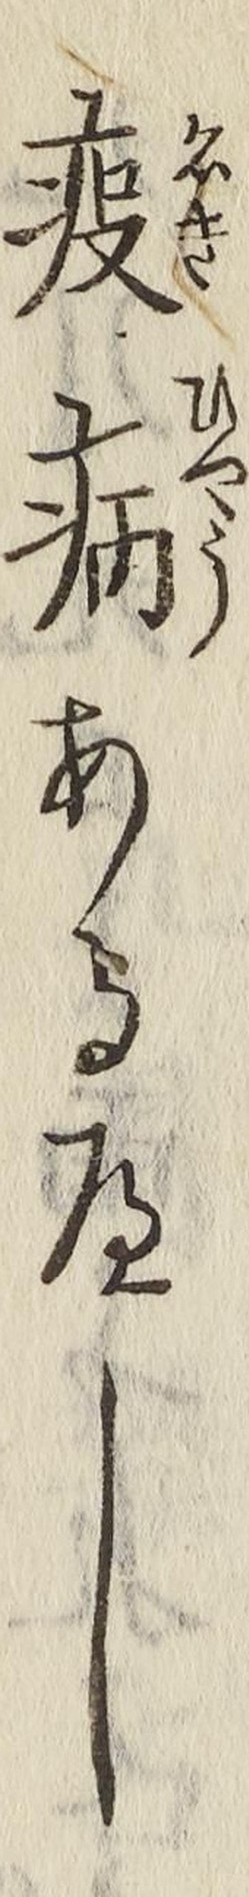疫病あるへし
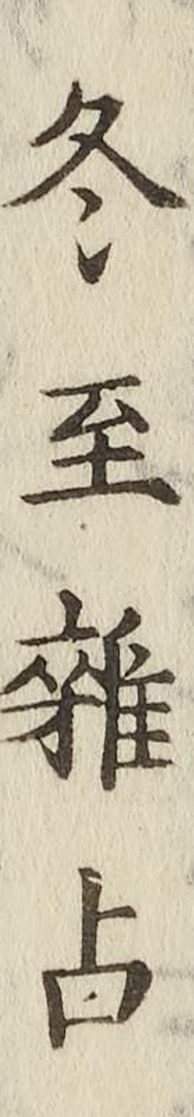冬至雑占
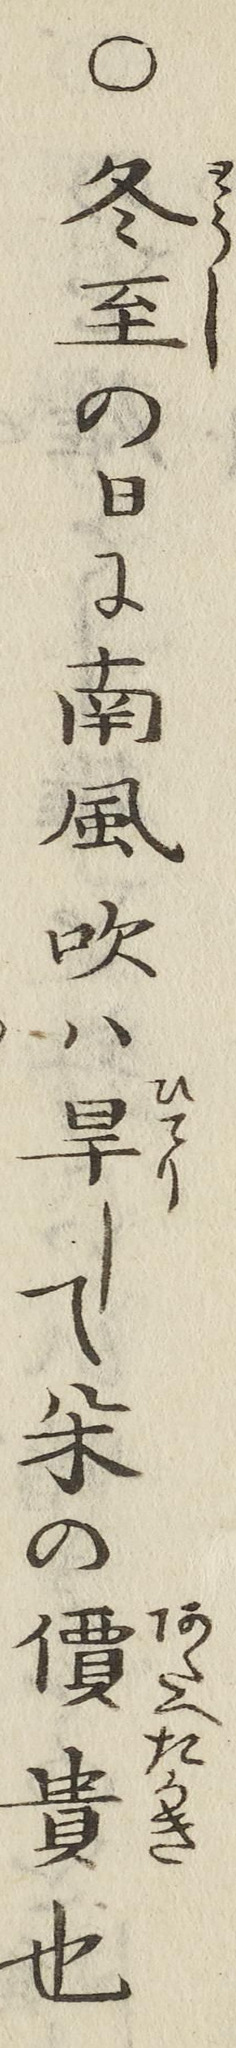○冬至の日に南風吹は旱して米の価貴也
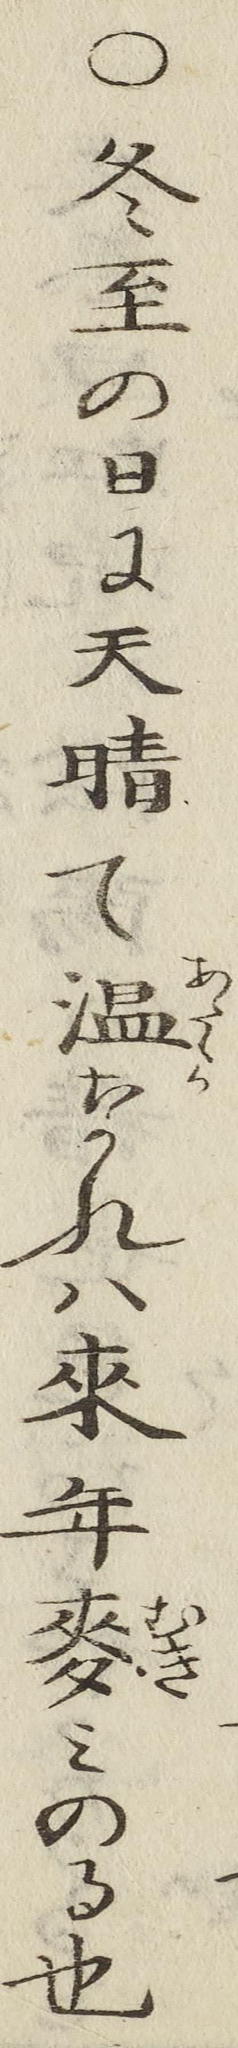○冬至の日に天晴て温なれは来年麦みのる也
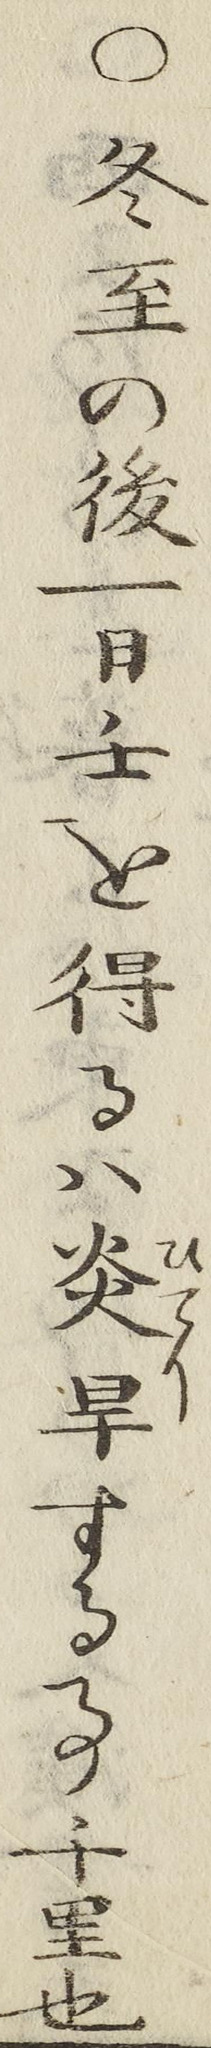○冬至の後一日壬を得るは炎旱する事千里也
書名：天時占候　二
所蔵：東京大学地震研究所図書室 Earthquake Research Institute Library, The University of Tokyo, JAPAN
